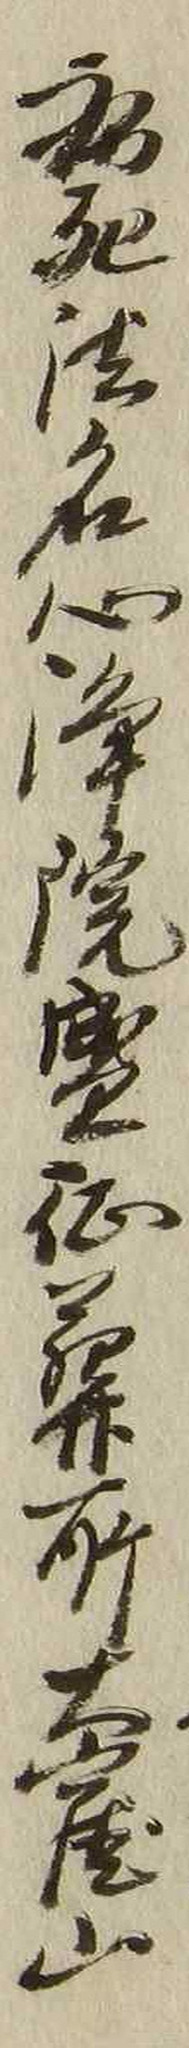病死法名心浄院盛征葬所大寵山
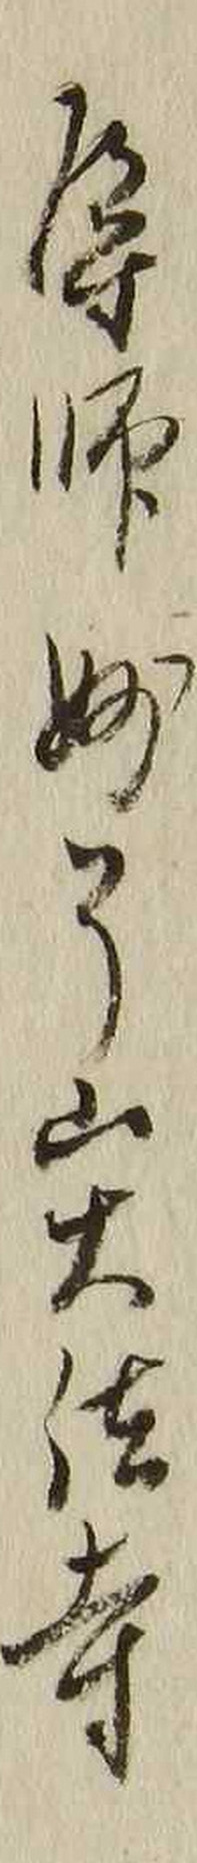導師妙了山大法寺
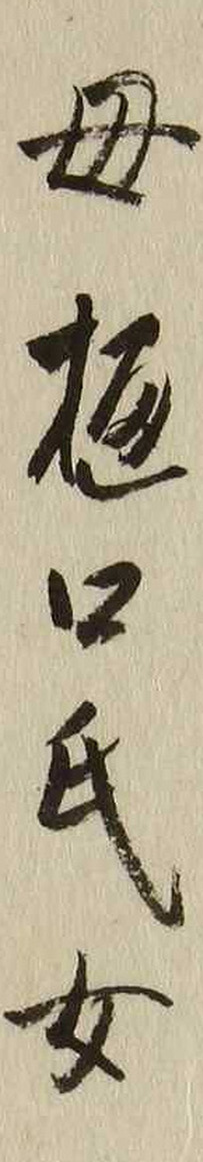母樋口氏女
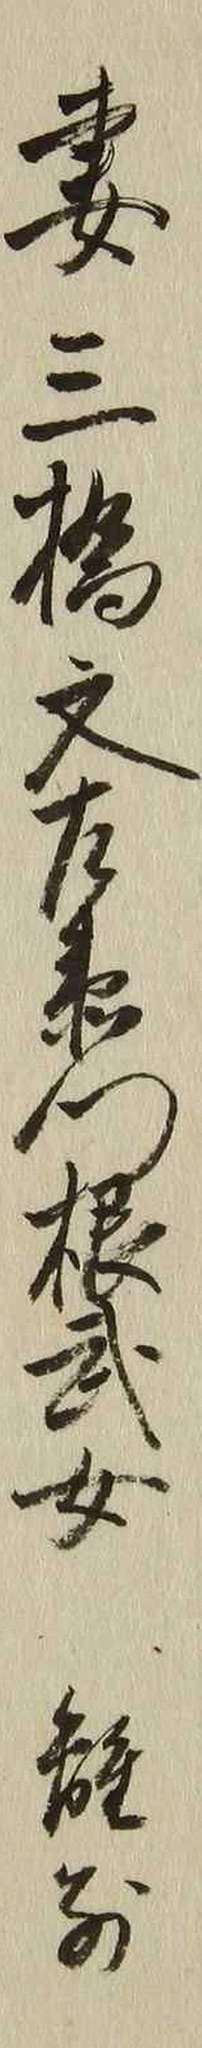妻三橋文左衛門根武女離別
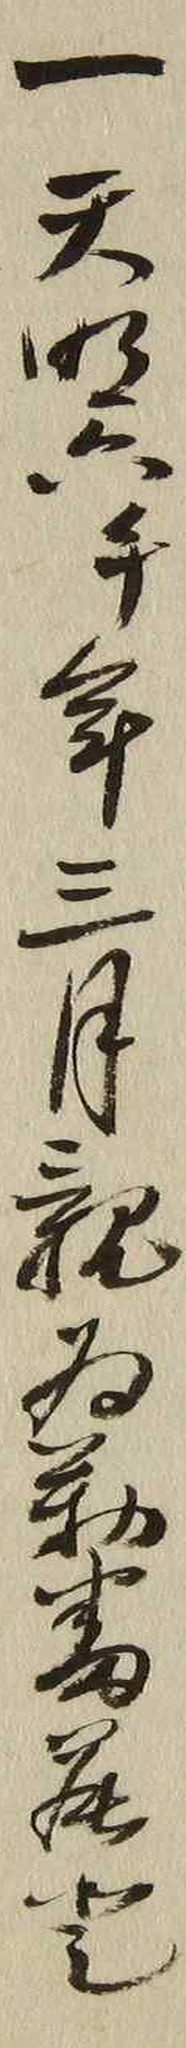一天明六午年三月親為勤番罷登
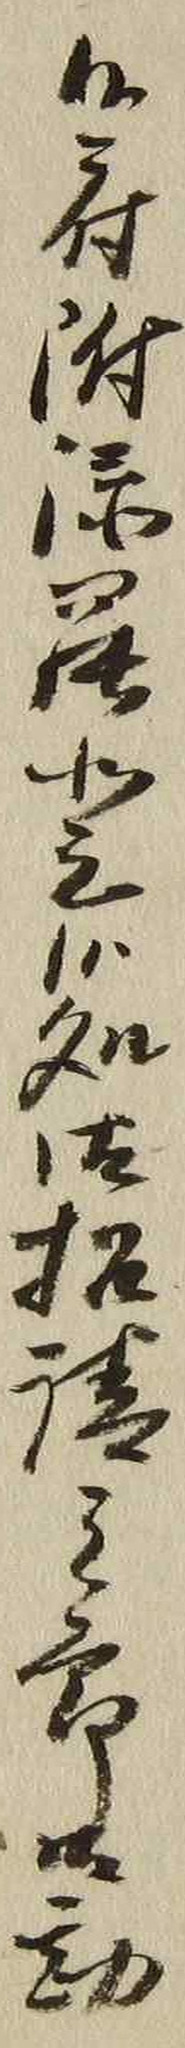候に付附添罷登候処御招請之節御勘
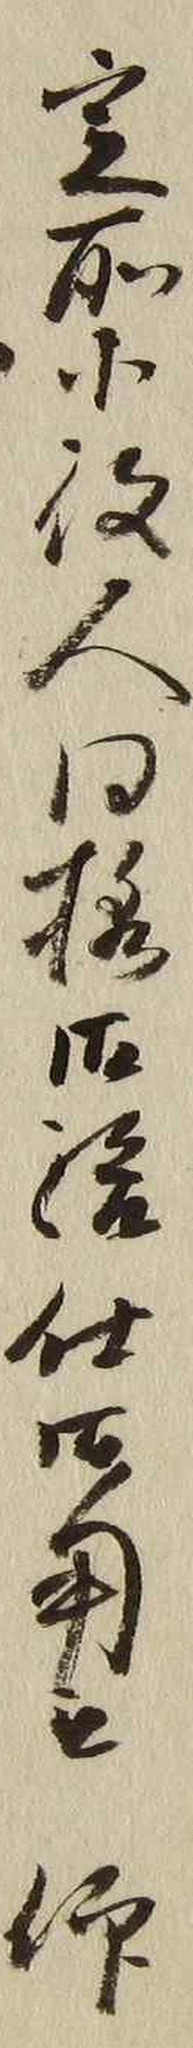定所小役人同様御詰仕御用被仰
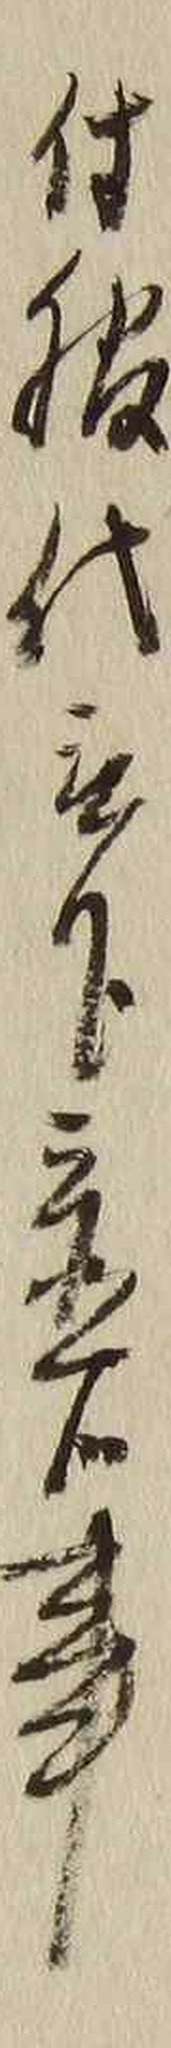付服代被下置候事
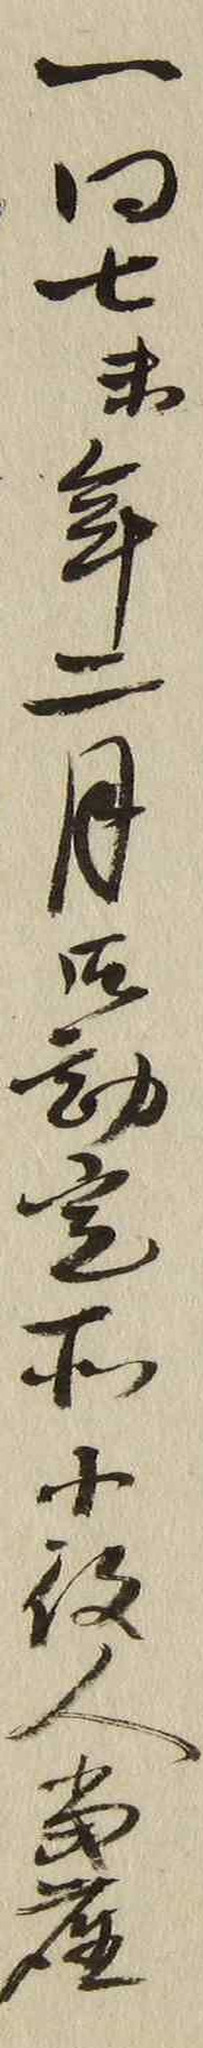一同七未年二月御勘定所小役人当座
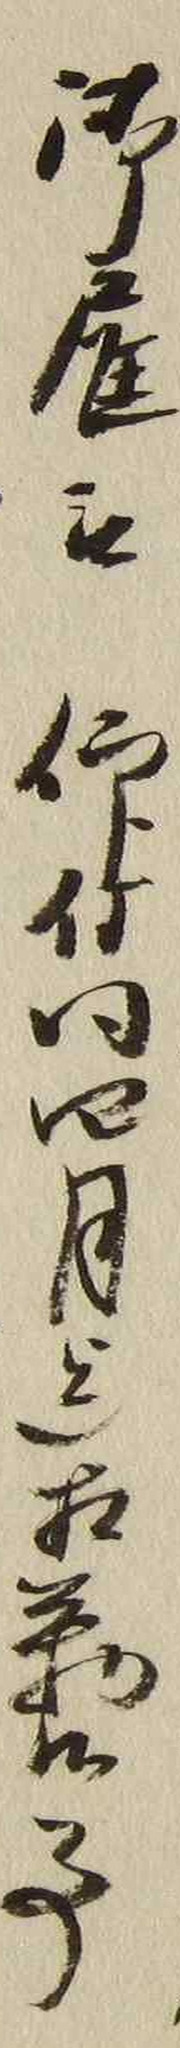御雇被仰付同四月迄相勤候事
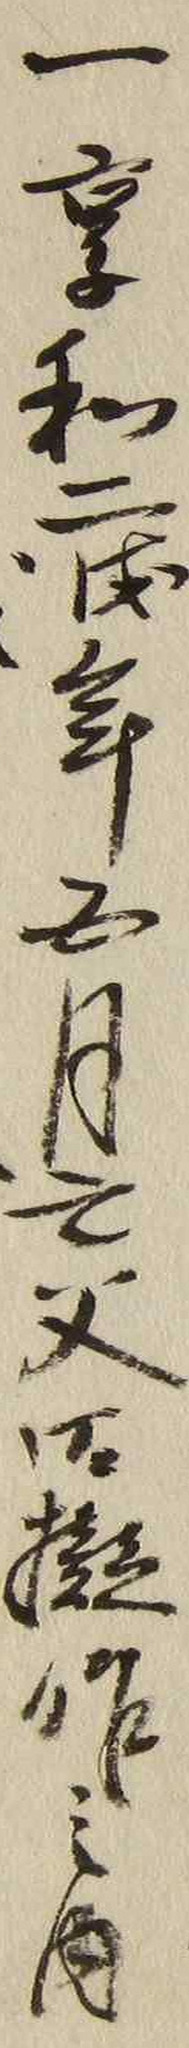一享和二戌年五月亡父御擬作之内
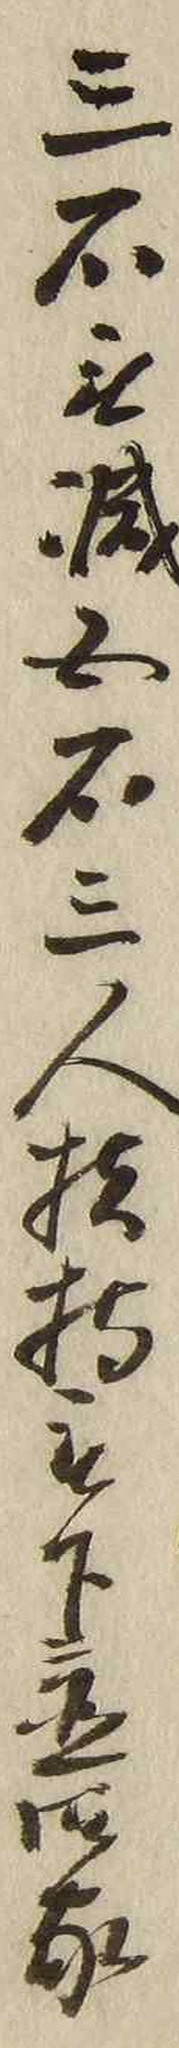三石被減五石三人扶持被下置御家

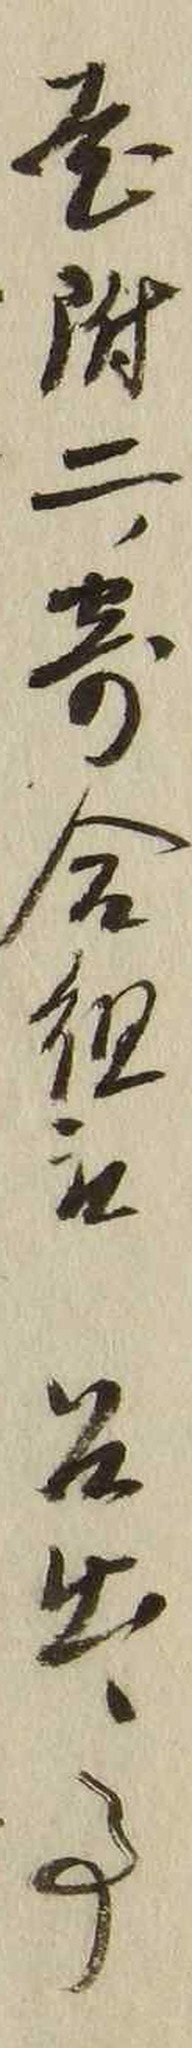老附二ノ寄合組被召出候事
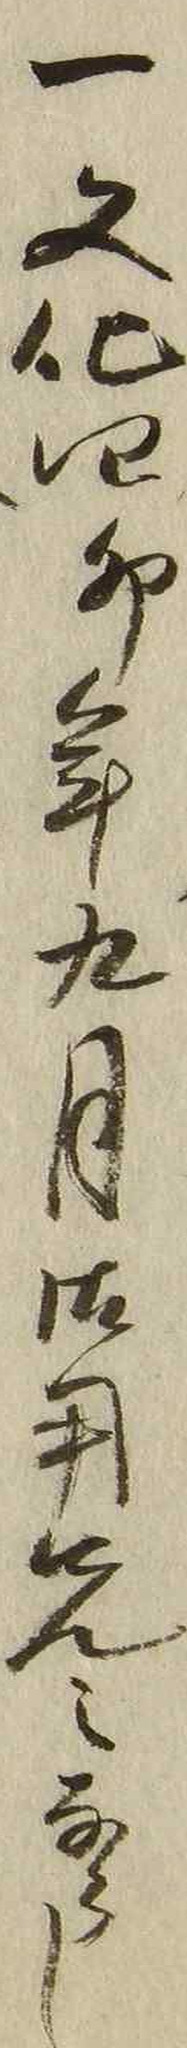一文化四卯年九月御用先之ならし
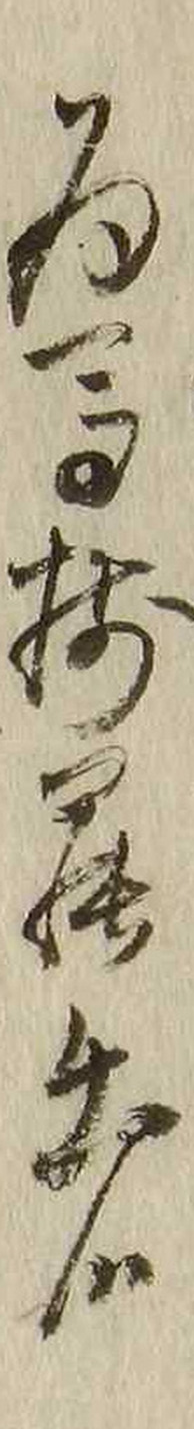為馬揃罷出候
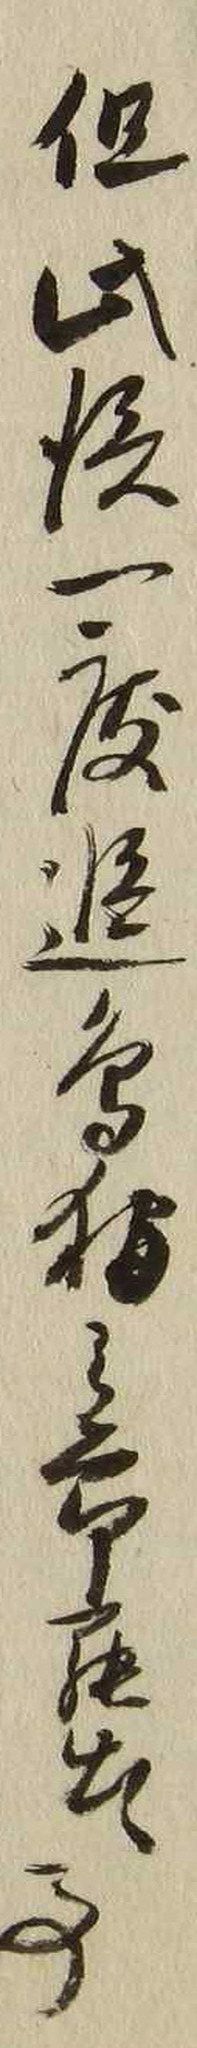但此後一度追鳥狩之節罷出候事
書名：諸士系譜　巻之360　す之部10
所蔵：会津若松市立会津図書館
